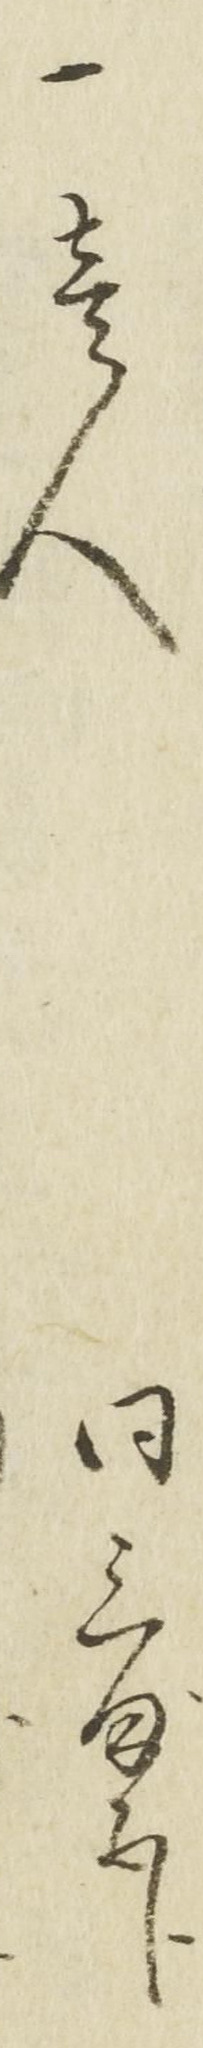一壱人同三匁五分
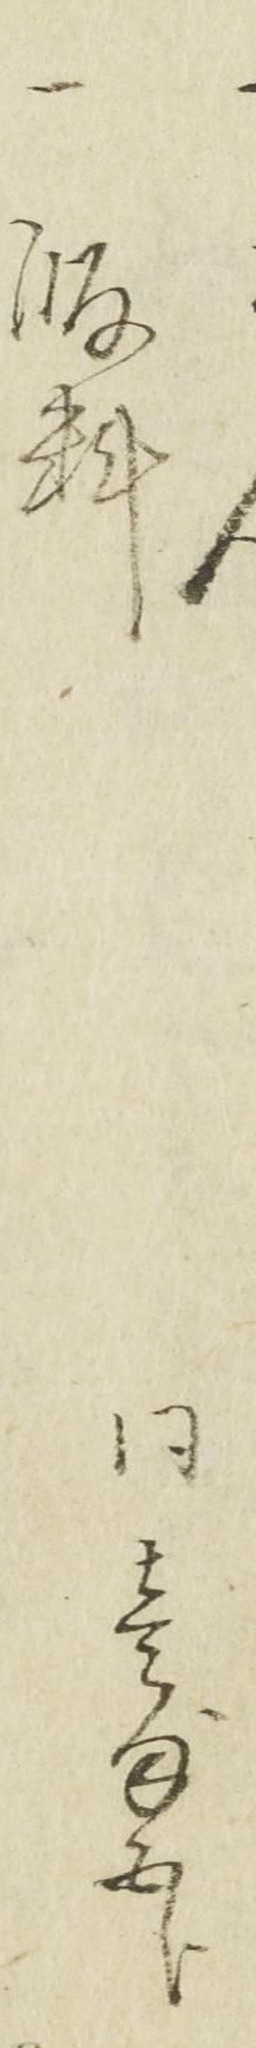一飯料同壱匁五分
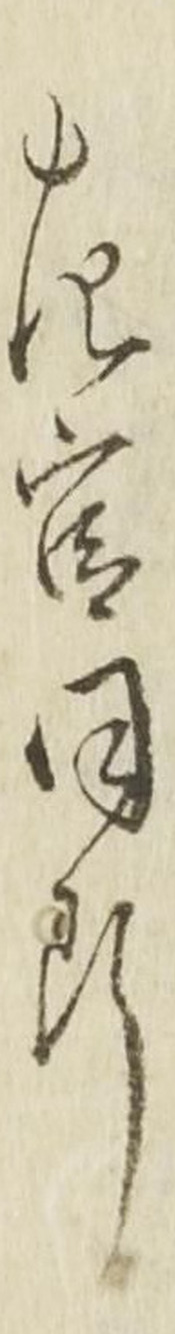左官同断
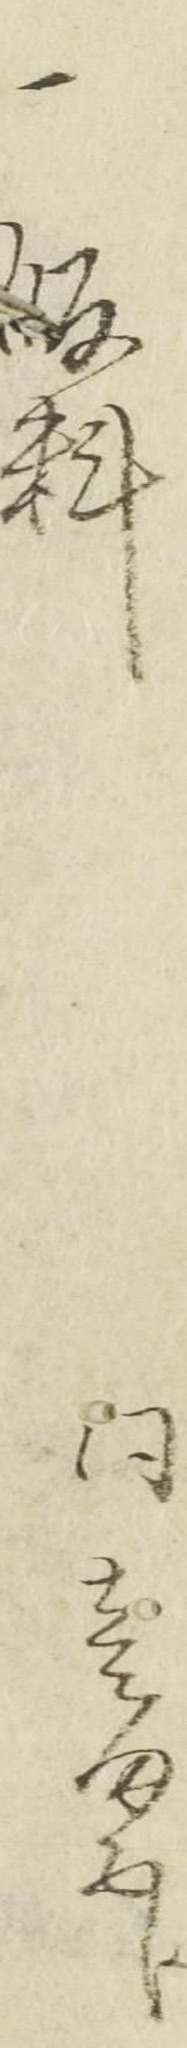一飯料同壱匁五分
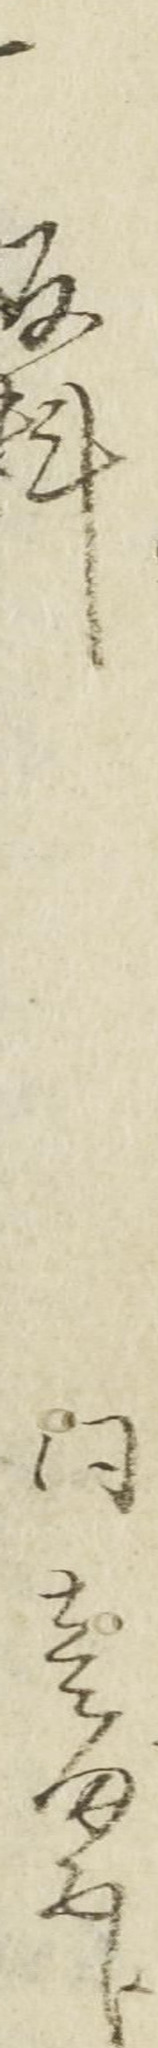一飯料同壱匁五分
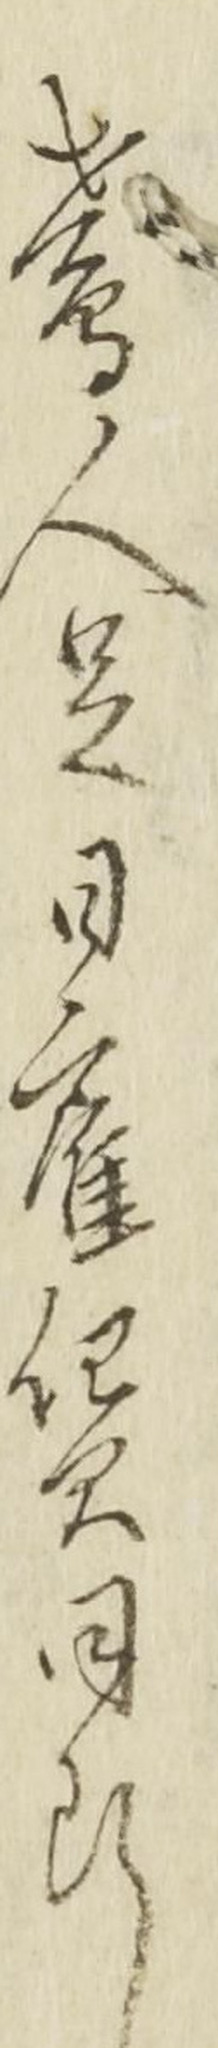鳶人足日雇賃同断
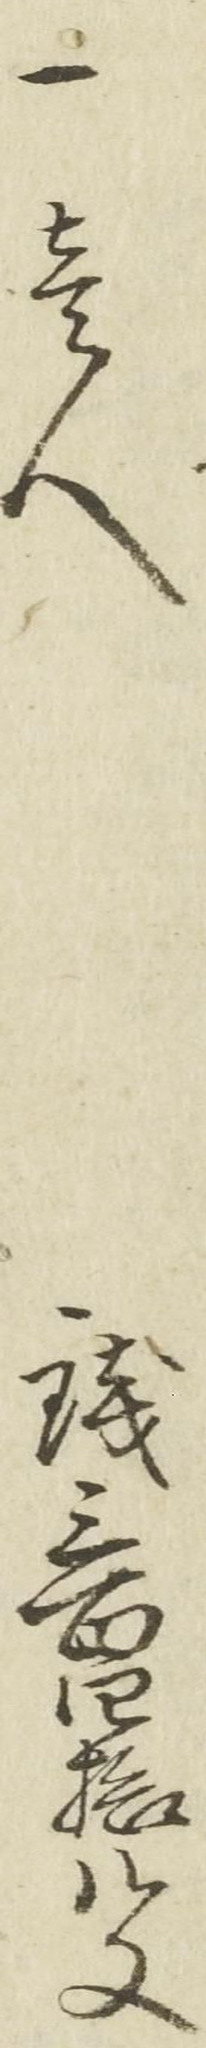一壱人銭三百四拾八文
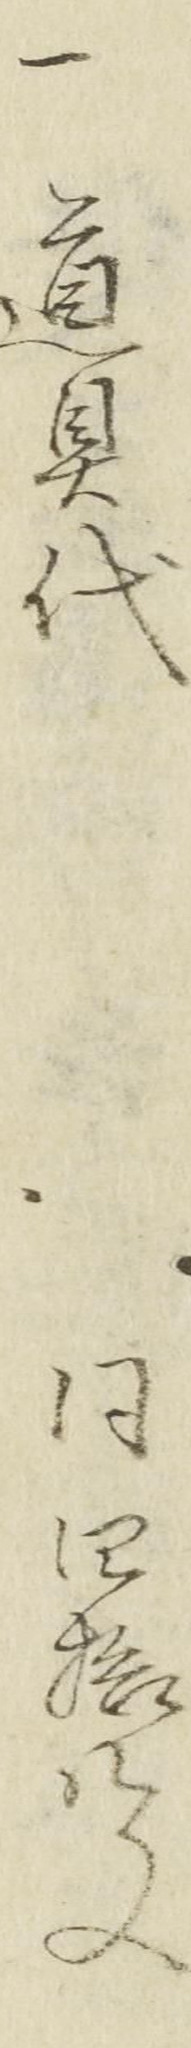一道具代同四拾八文
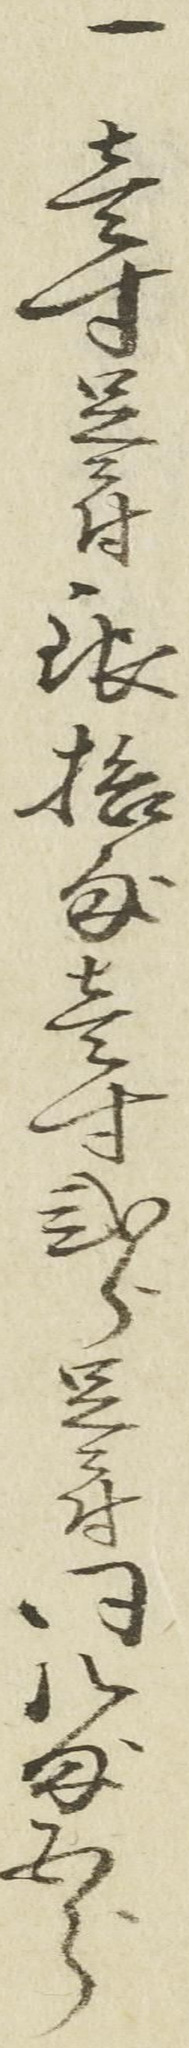一壱寸足二付銀拾匁壱寸弐分足ニ付同八匁五分
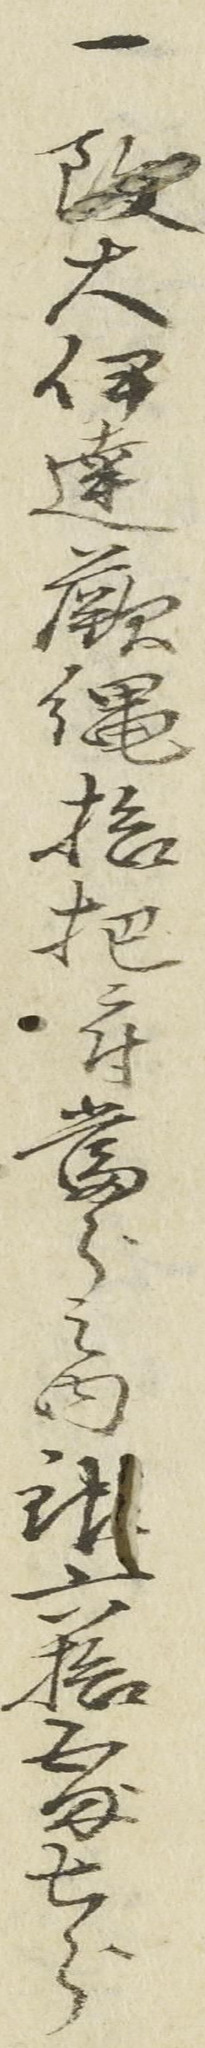改&;虫食&;大伊達蕨縄拾把二付当分之内銀六拾五匁七分
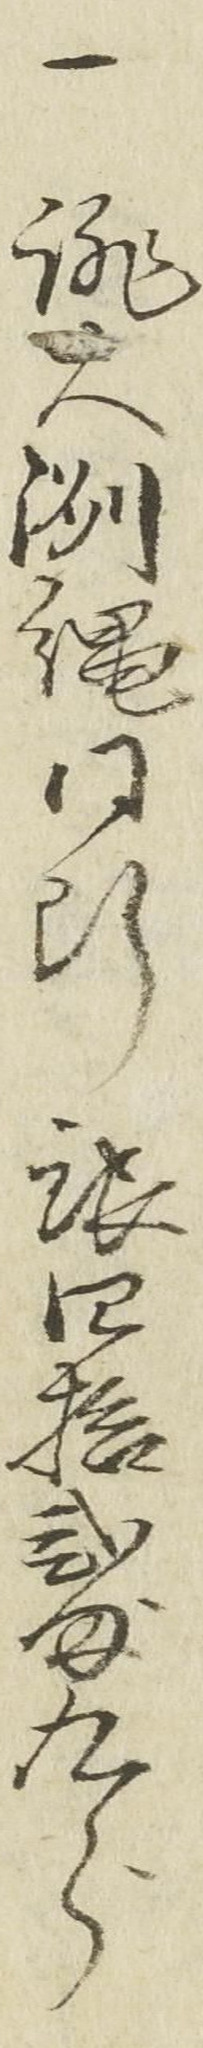一誂大洲縄同断銀四拾二匁九分
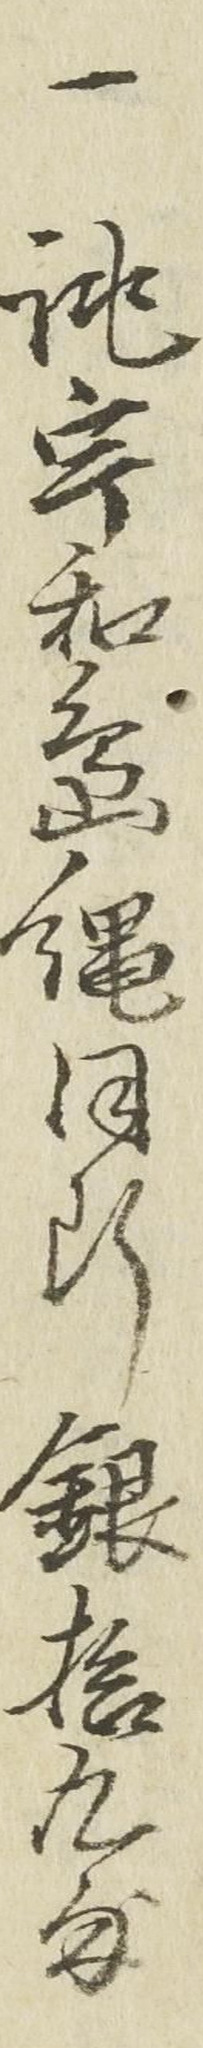一誂宇和島縄同断銀拾九匁
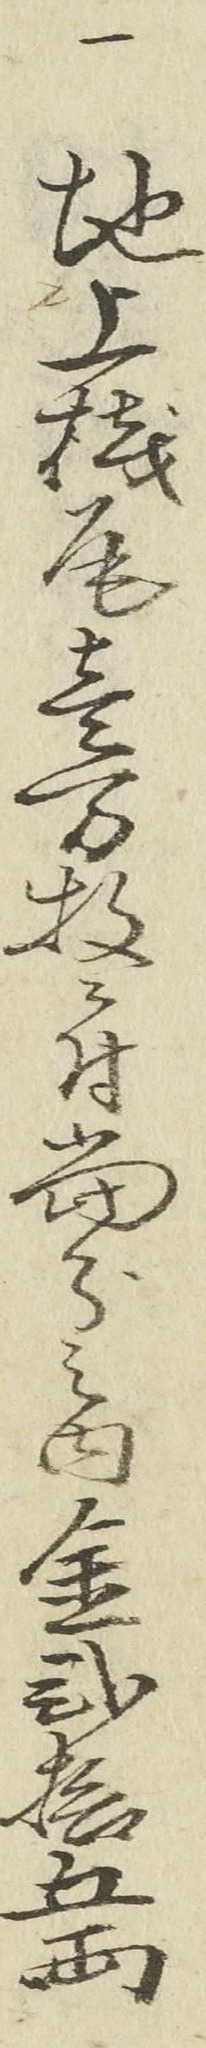一地上棧瓦壱万枚ニ付当分之内金弐拾五両
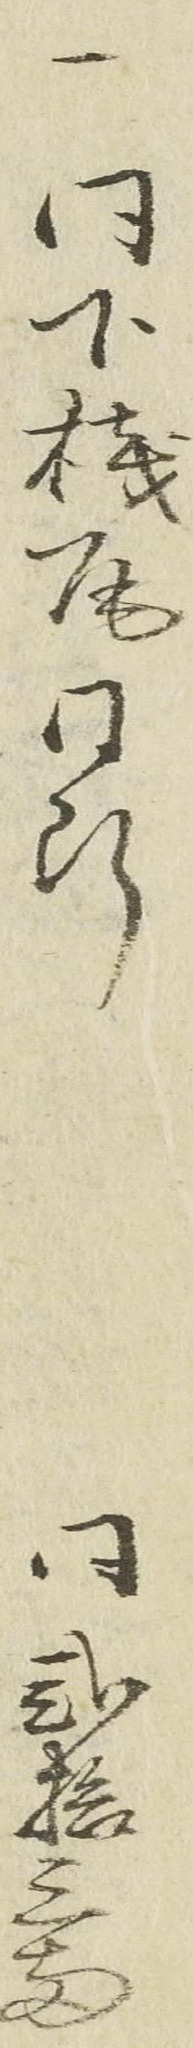一同下棧瓦同断同弐拾三両
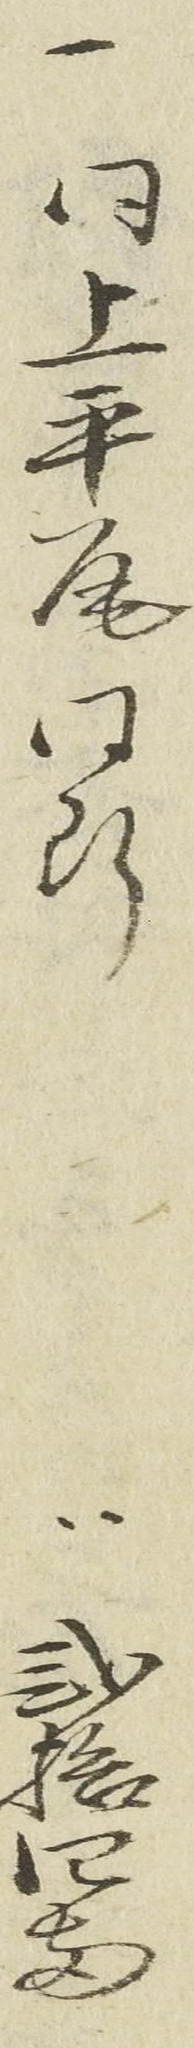一同上平瓦同断同弐拾四両
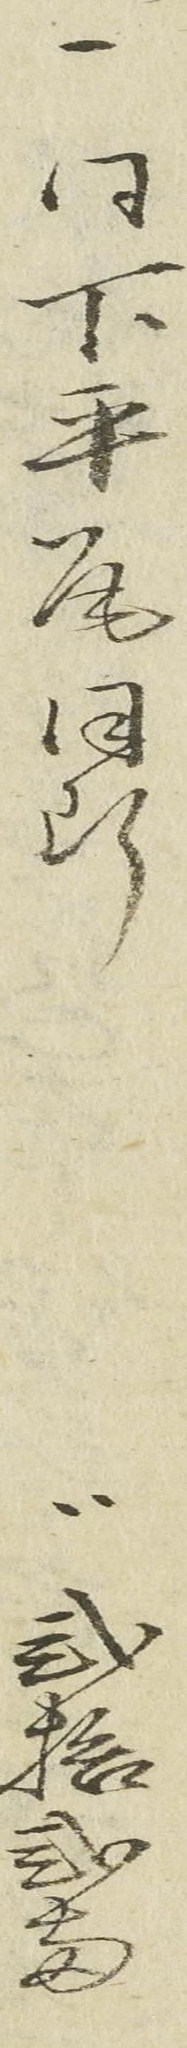一同下平瓦同断同弐拾弐両
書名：安政二乙卯年十月二日大地震之事
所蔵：東京大学地震研究所図書室 Earthquake Research Institute Library, The University of Tokyo, JAPAN
